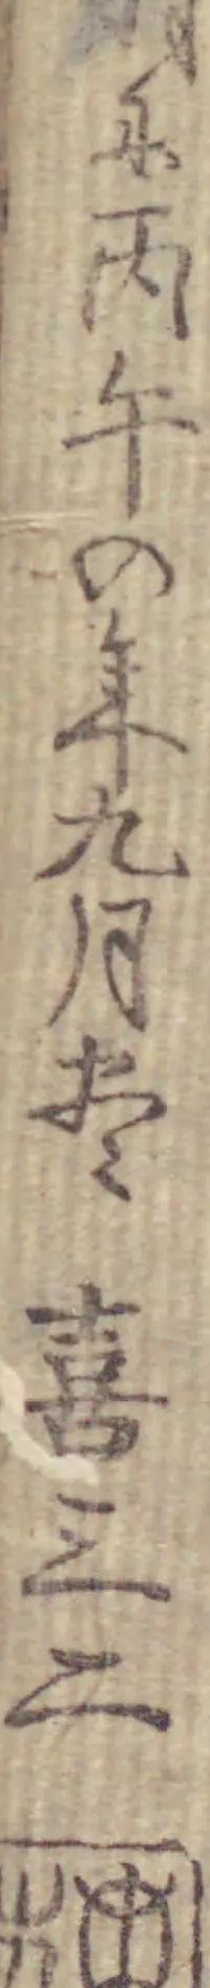時に丙午の年九月尽喜三二
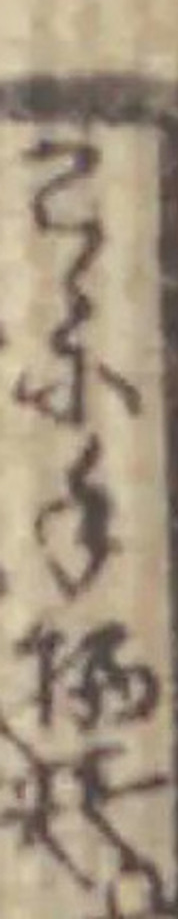こゝに手柄
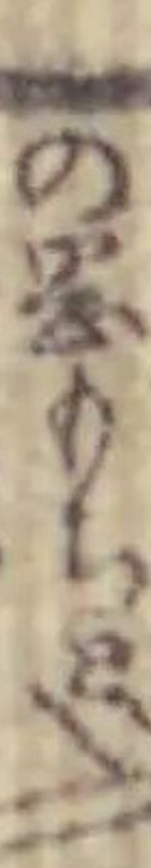の岡もちと
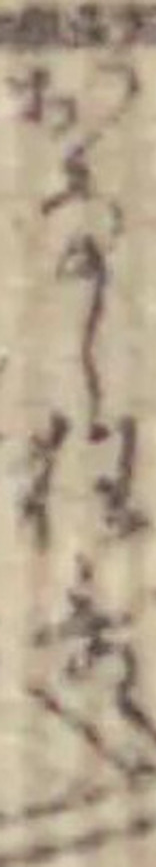おなし狂歌
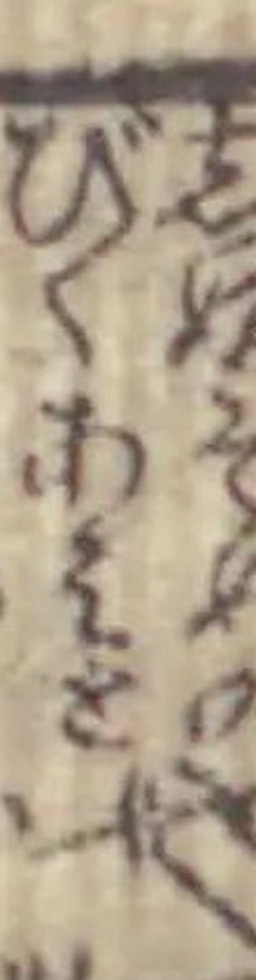びくあみと

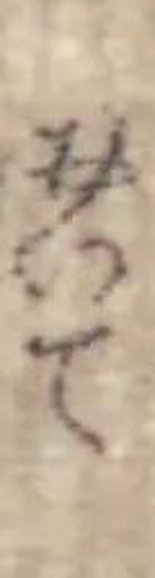おいて
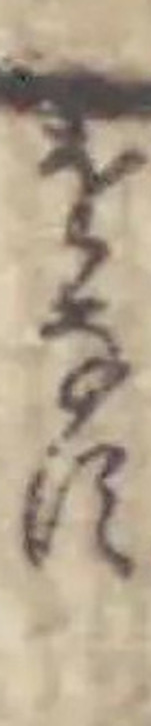をなす
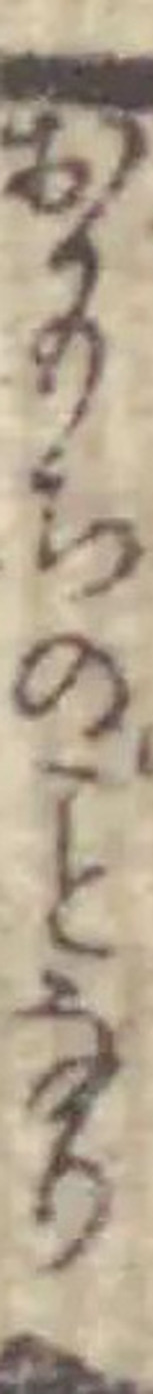おかもちのことなり
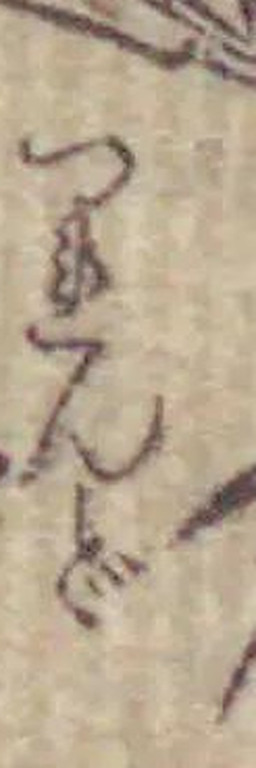つれんど
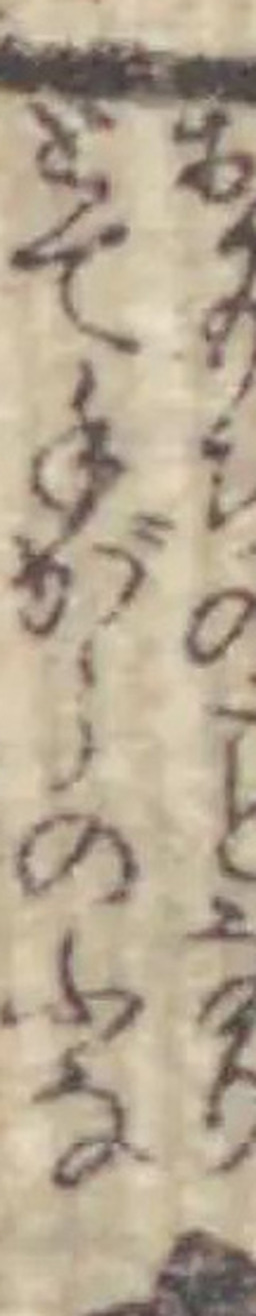とて手がらのふな
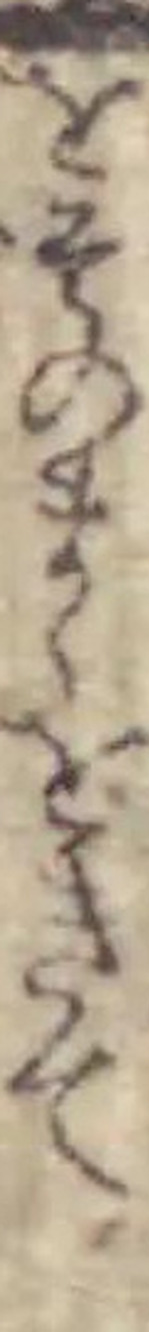をそのまゝをきて
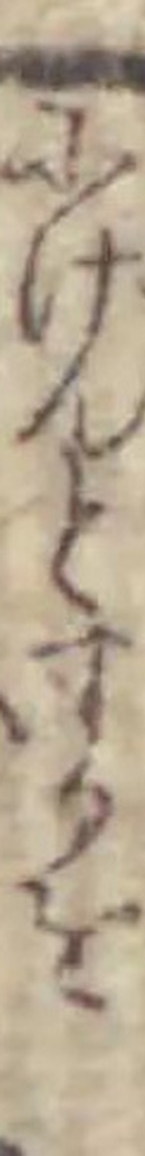にげんとするを
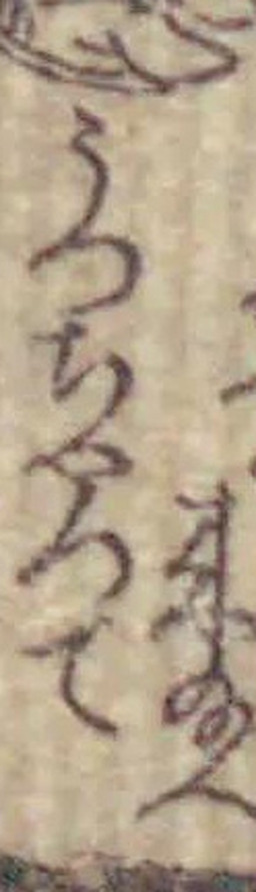うつちやつて
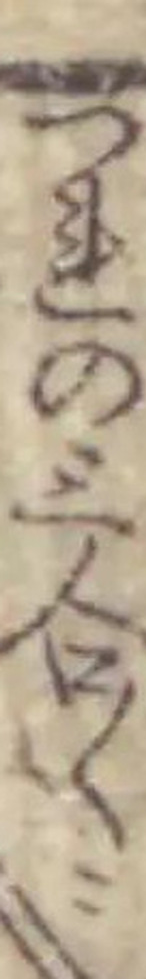つれの三人口〳〵ニ
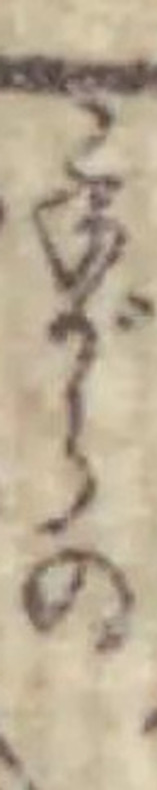手がらの
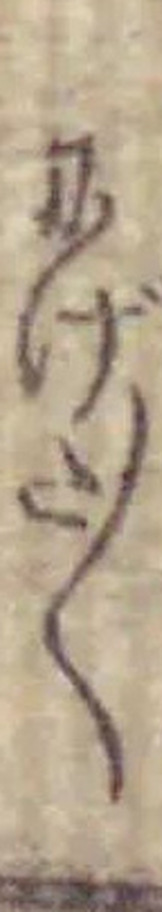にげた〳〵
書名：亀山人家妖 3巻
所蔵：国立国会図書館 National Diet Library, JAPAN
